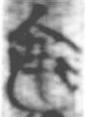裘
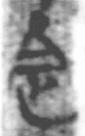定
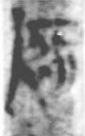所
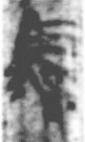馭（御）
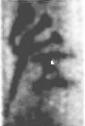○（左）
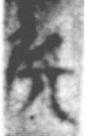○（殿）
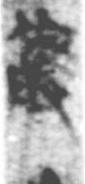雘
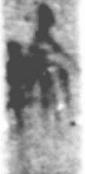輪
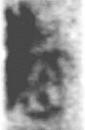弼
